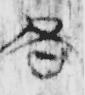各
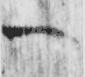一
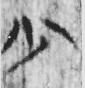少
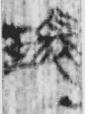環
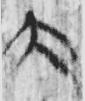大
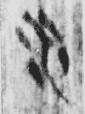水
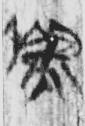備（佩）
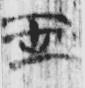玉
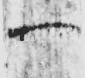一
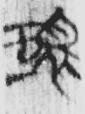環
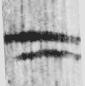二
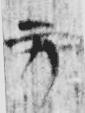天
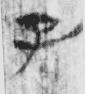子
